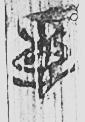惠
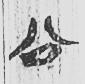公
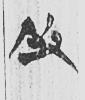及
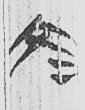文=
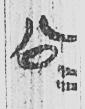公=
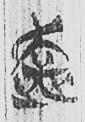奔
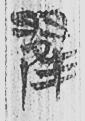翟
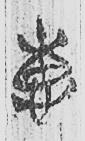惠
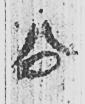公
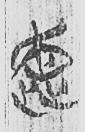奔
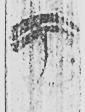于
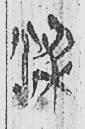梁
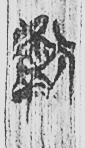獻
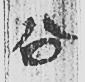公
